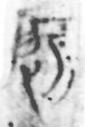所
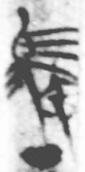馭（御）
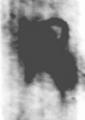君
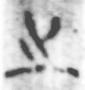之
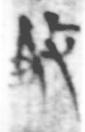○（畋）
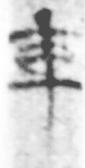車
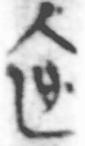哀
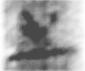之
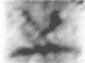之
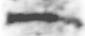一
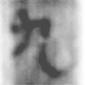九
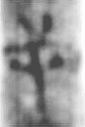矢
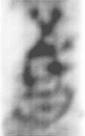晉（縉）
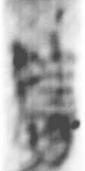○（席）
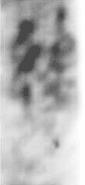縞
